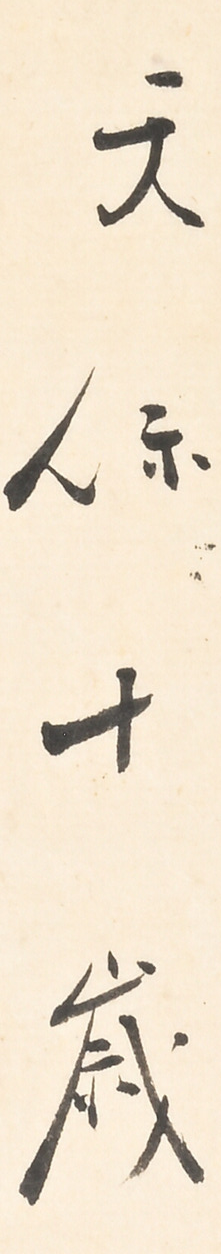天保十歳
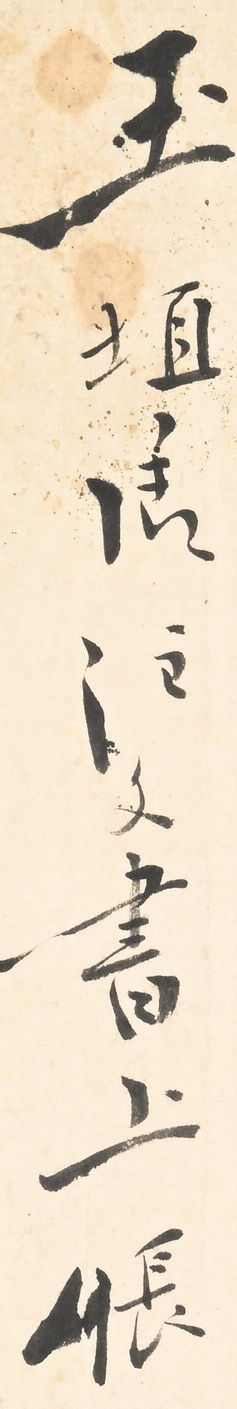玉垣御注文書上帳

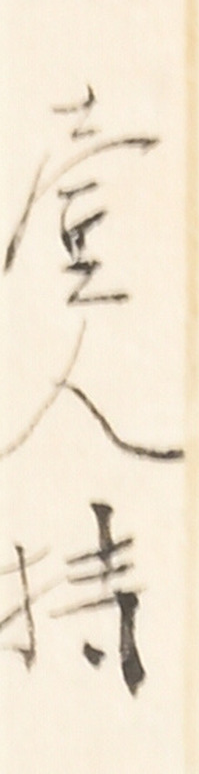弐人持
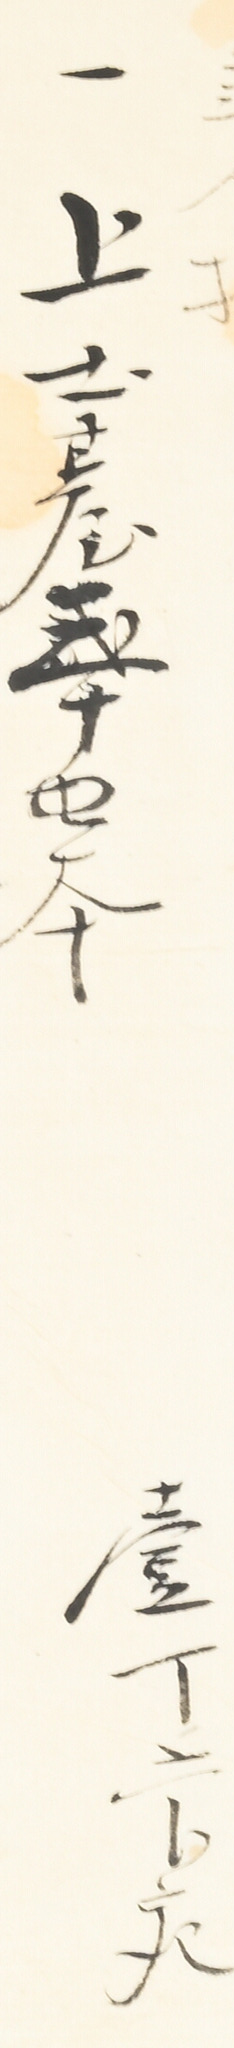一上土台五十四本壱丁六分宛
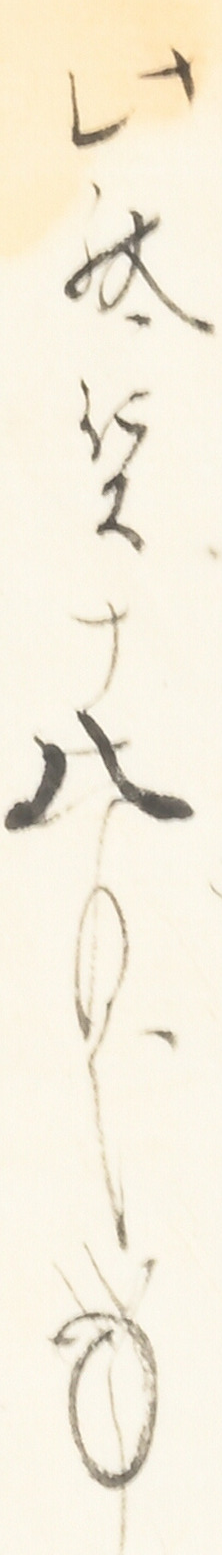此駄賃十八匁

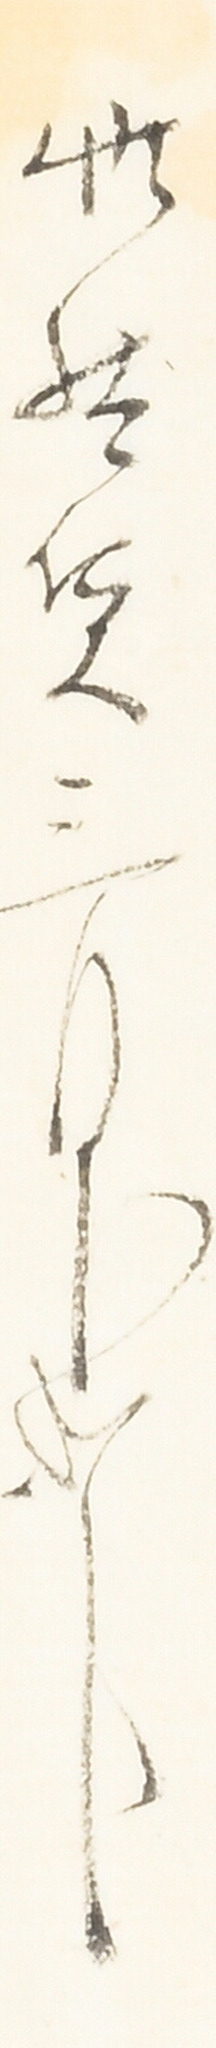此駄賃三匁弐分

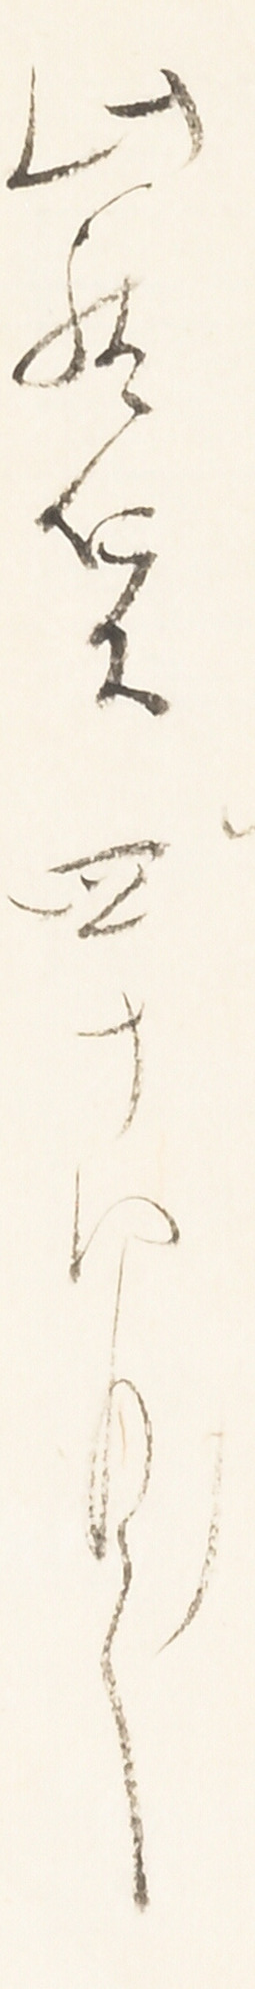此駄賃四十八匁

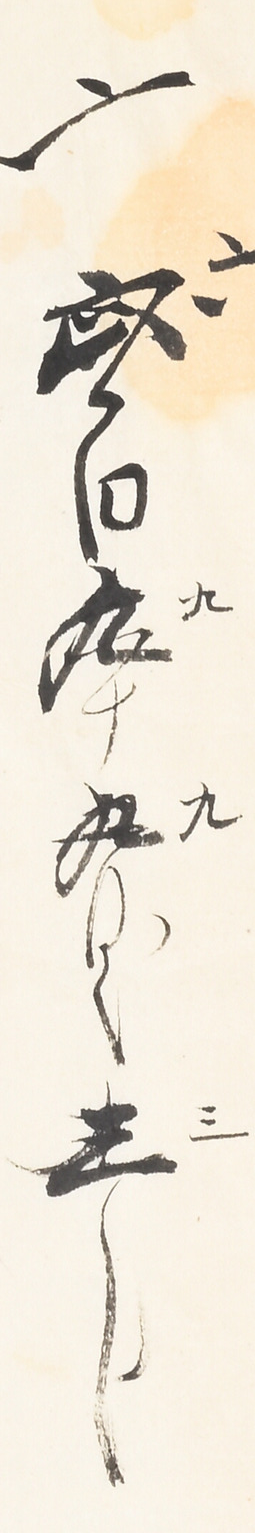〆六百九十九匁三分
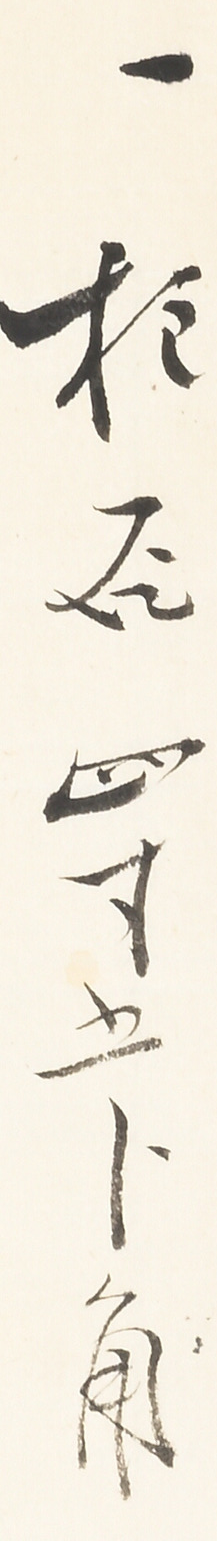一柱石四寸五分角
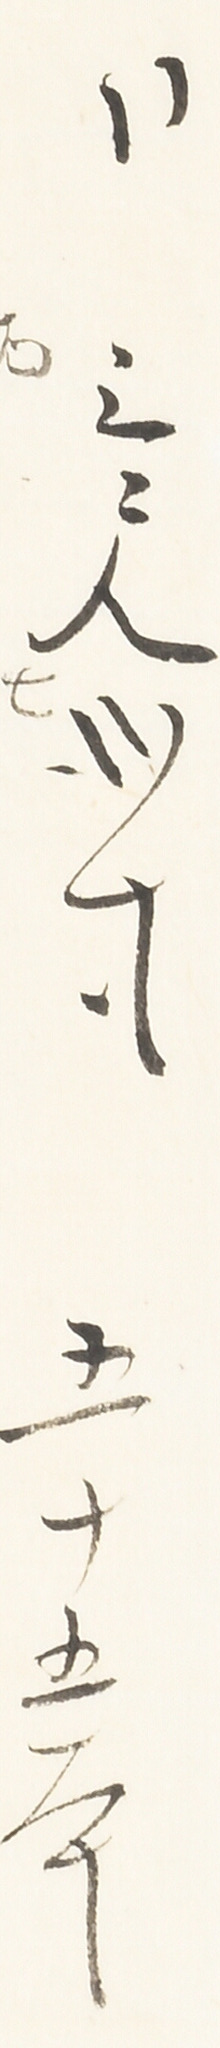同三尺弐寸五十五本
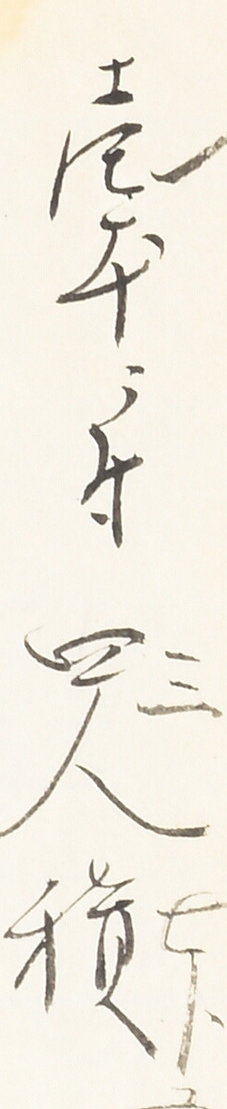壱本ニ付四人積

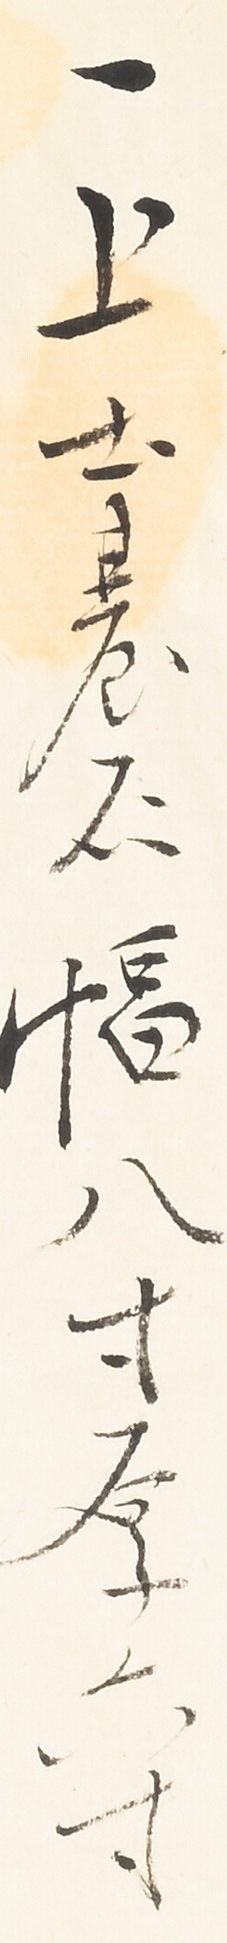一上土台石幅八寸厚六寸
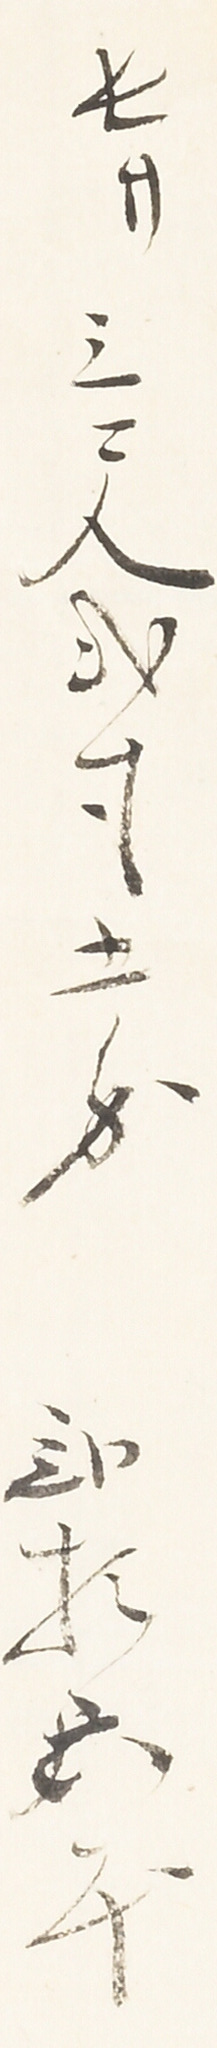長サ三尺弐寸五分弐拾六本
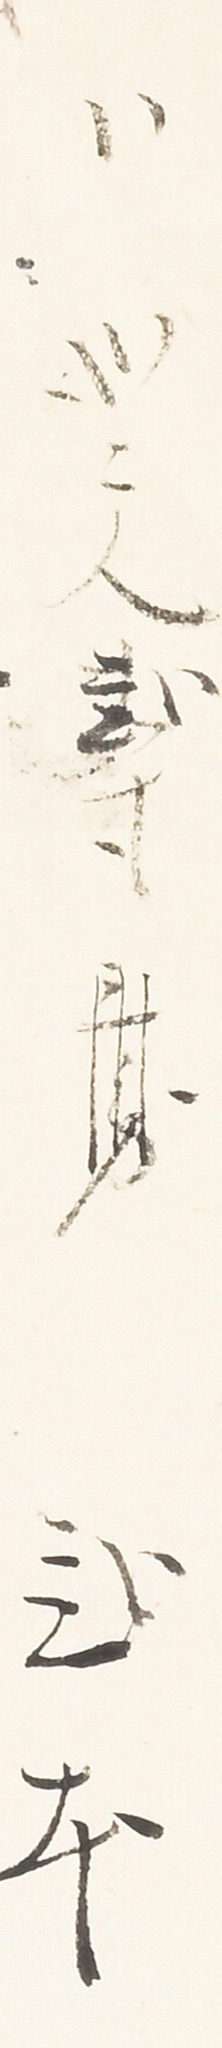〃弐尺弐寸弐本
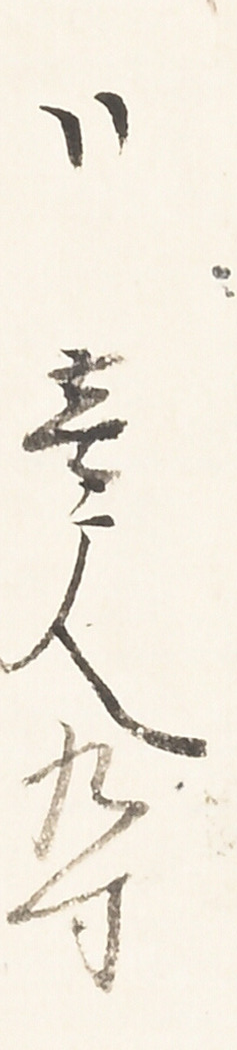〃壱人九寸
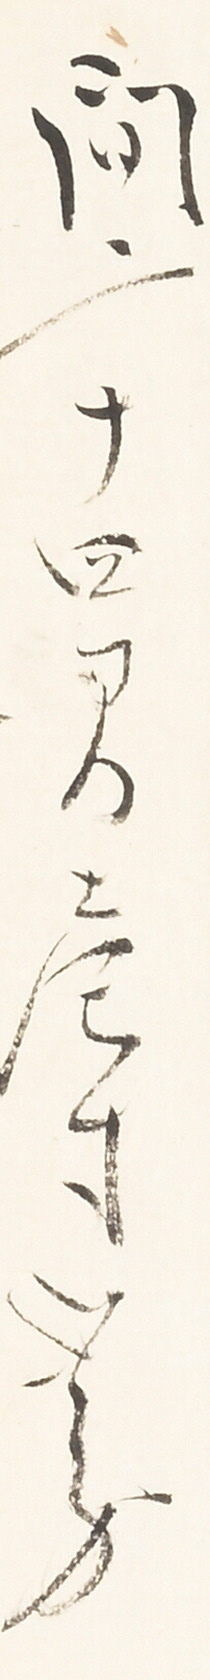間〆十四間壱寸弐分
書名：天保十歳亥六月日玉垣御注文書上帳
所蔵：伊那市立高遠町図書館・合同会社AMANE
